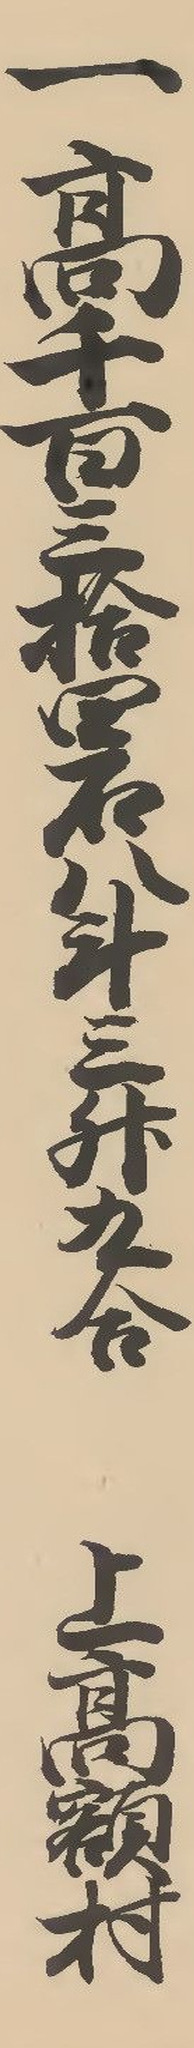一高千百三拾四石八斗三升九合上高額村
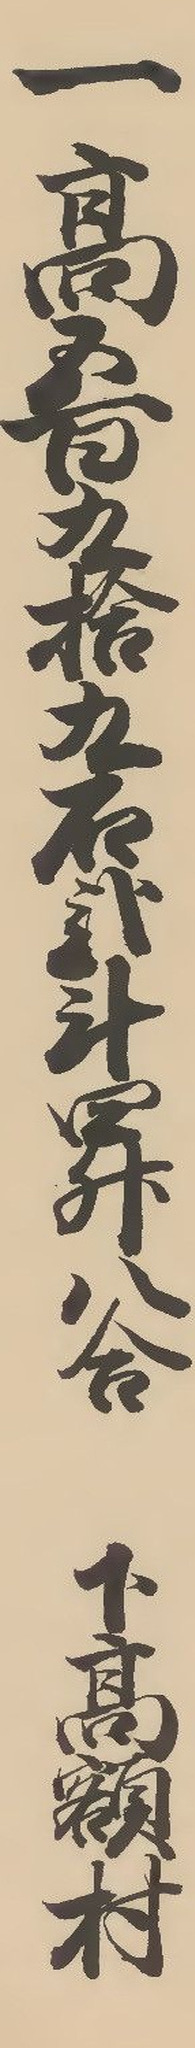一高五百九拾九石弐斗四升八合下高額村
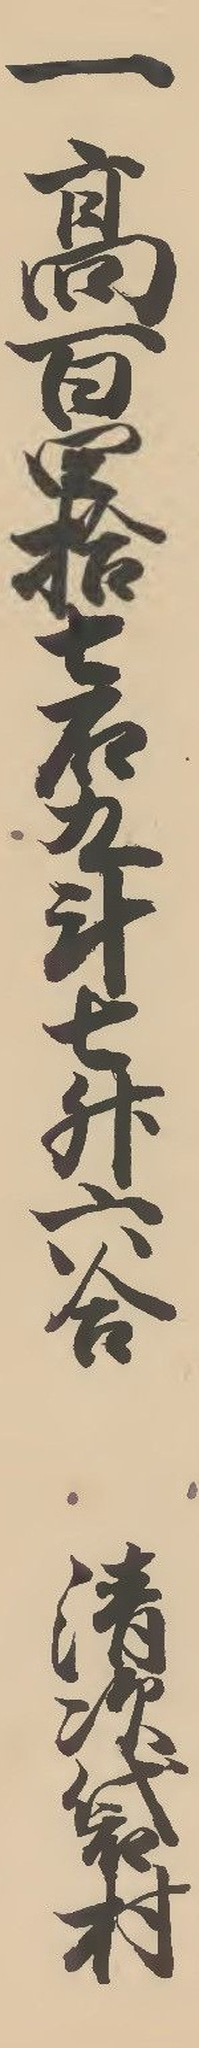一高百四拾七石九斗七升六合清次袋村

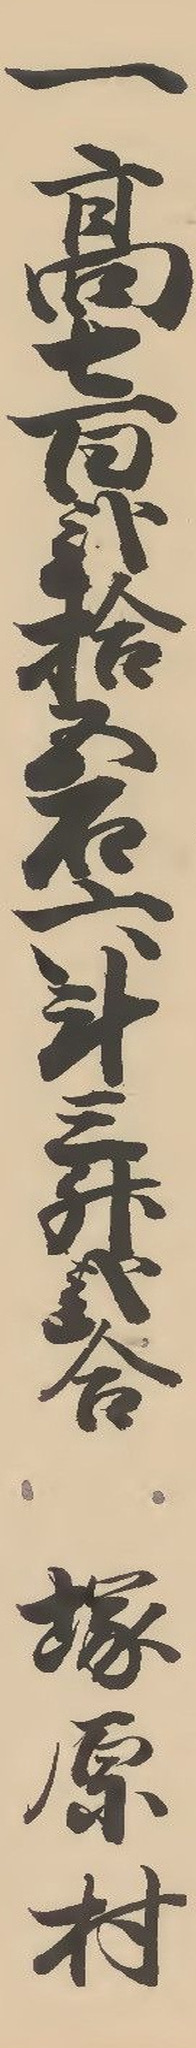一高七百弐拾五石六斗三升弐合塚原村
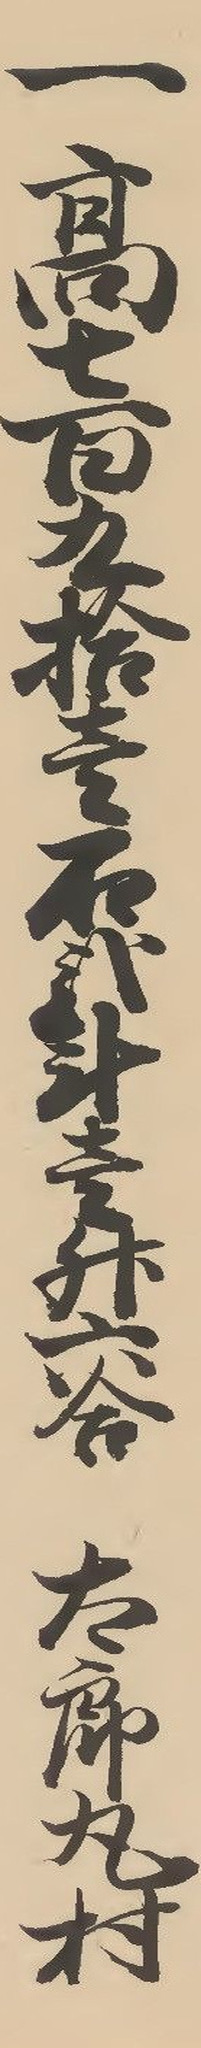一高七百九拾壱石弐斗壱升六合太郎丸村
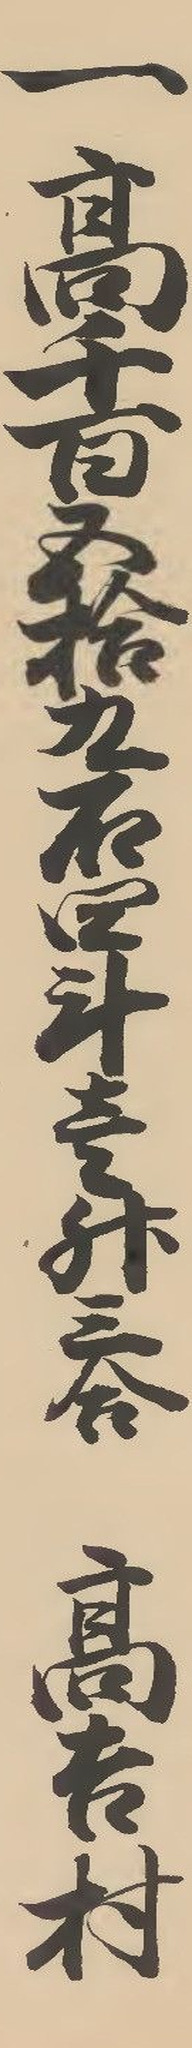一高千百五拾九石四斗壱升三合高吉村
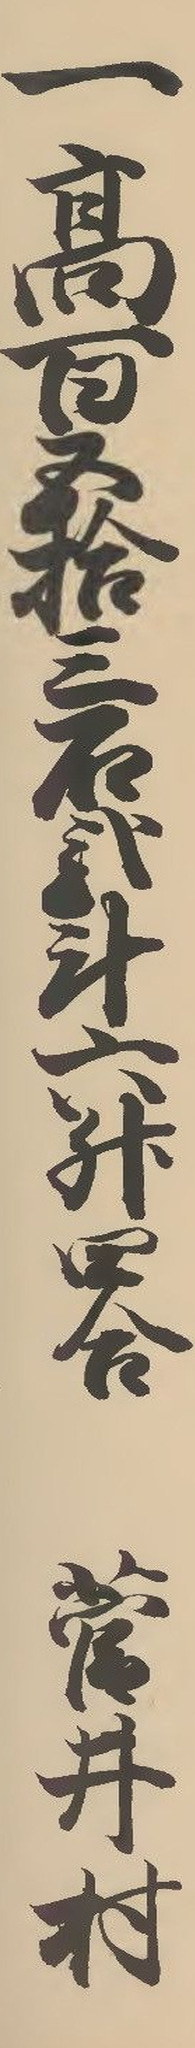一高百五拾三石弐斗六升四合菅井村
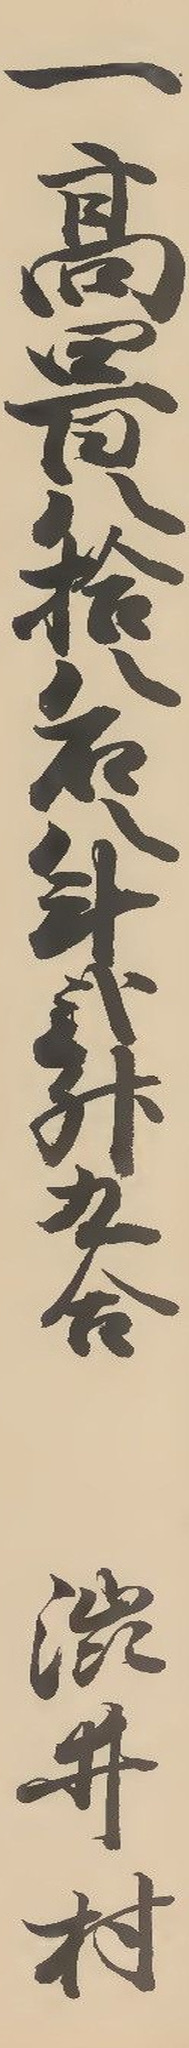一高四百八拾八石八斗弐升九合渋井村
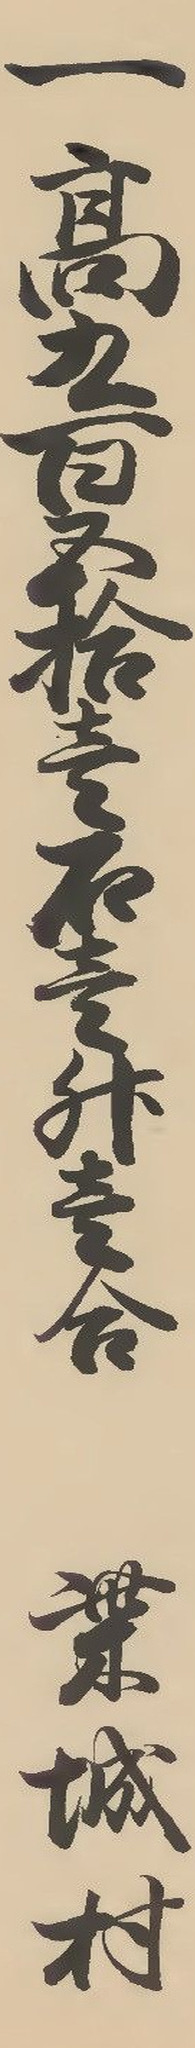一高九百五拾壱石壱升壱合柴城村
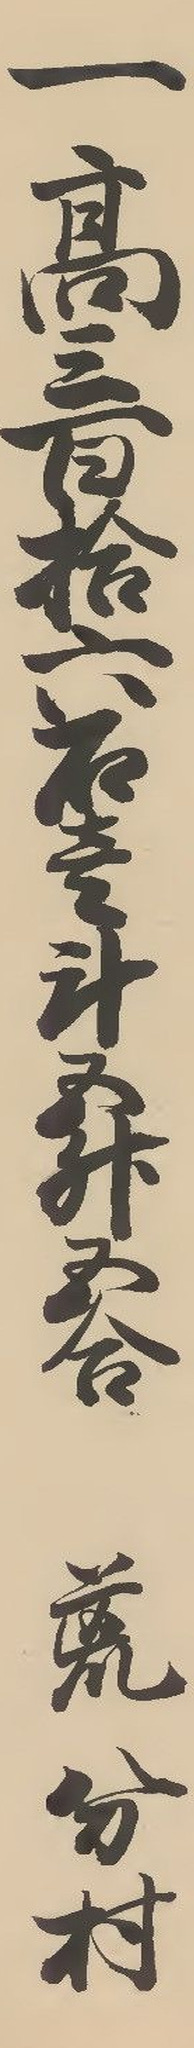一高三百拾六石壱斗五升五合荒分村
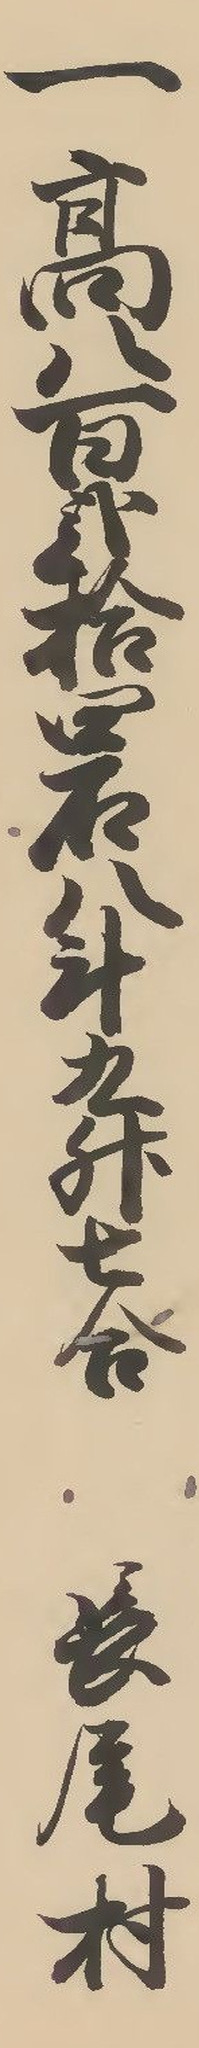一高八百弐拾四石八斗九升七合長尾村

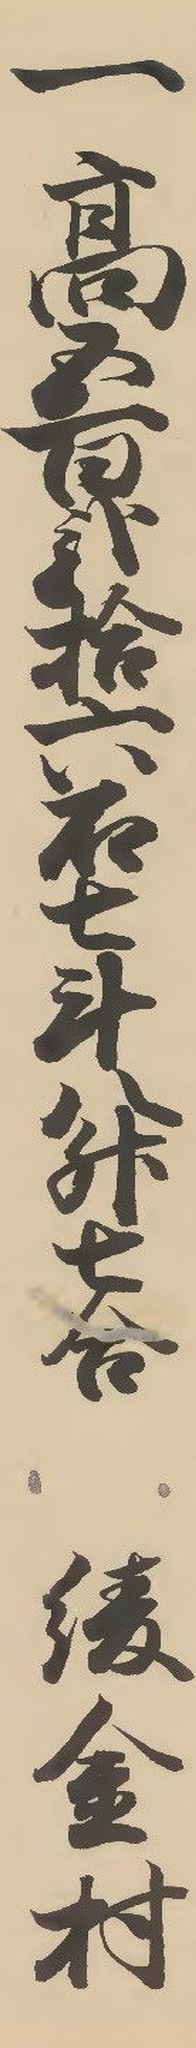一高五百弐拾六石七斗八升七合綾金村
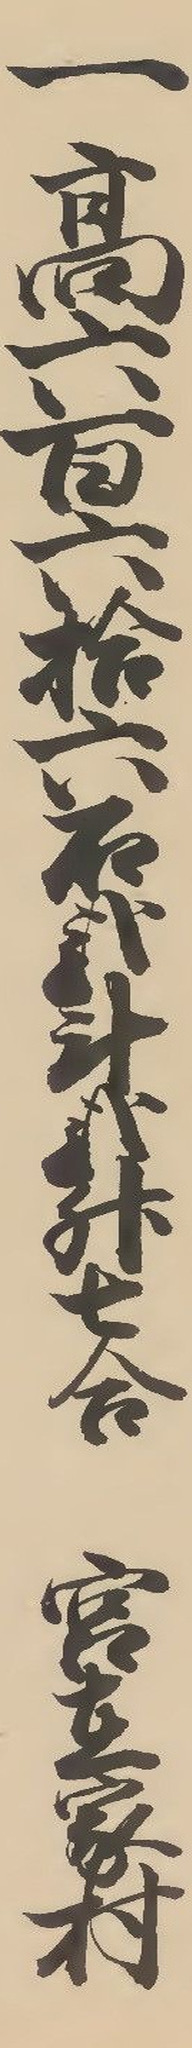一高六百六拾六石弐斗弐升七合宮在家村
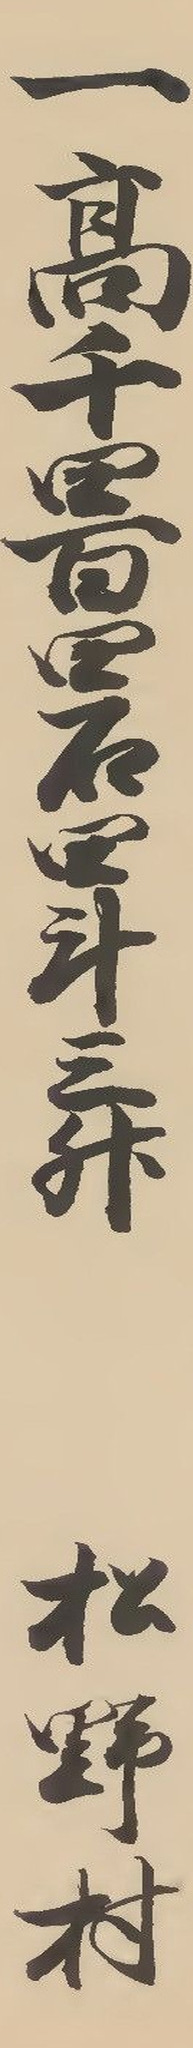一高千四百四石四斗三升松野村
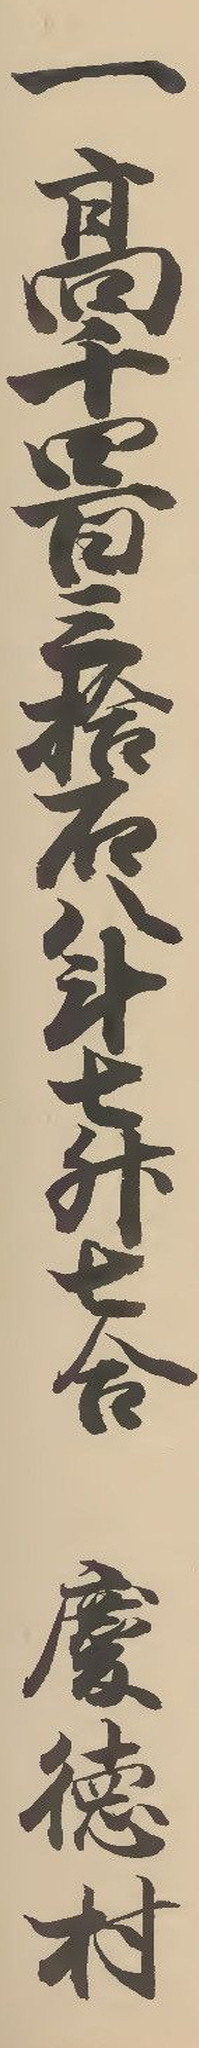一高千四百三拾石八斗七升七合慶徳村
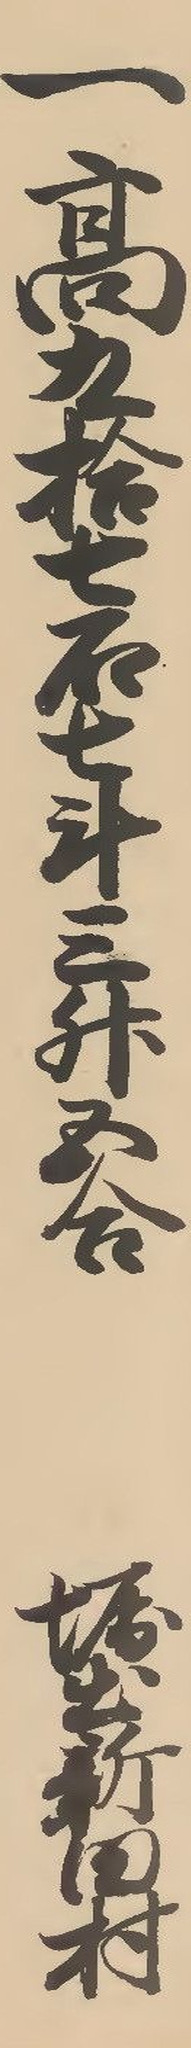一高九拾七石七斗三升五合堀出新田村
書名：陸奥国郷帳　１
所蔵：国立公文書館 National Archives of Japan
